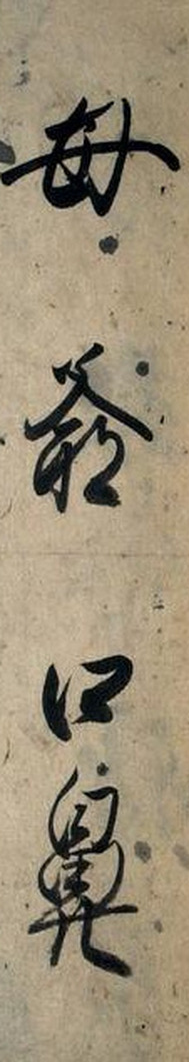母爺口鼻
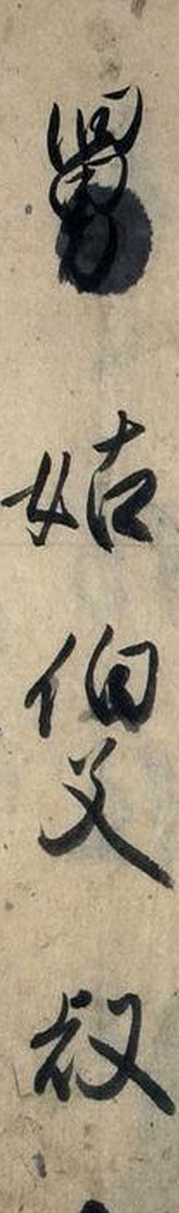舅姑伯父叔
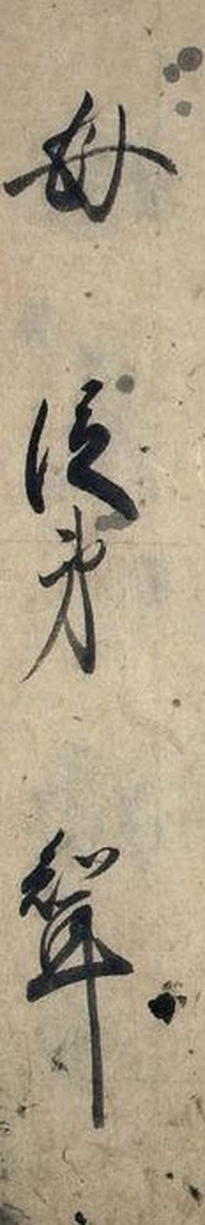母従弟聟

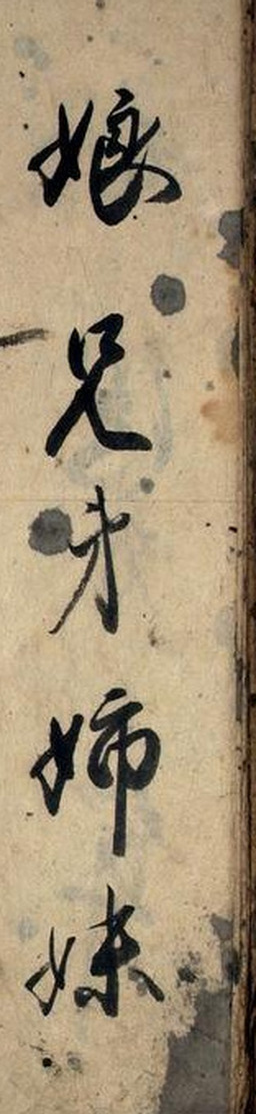娘兄弟姉妹
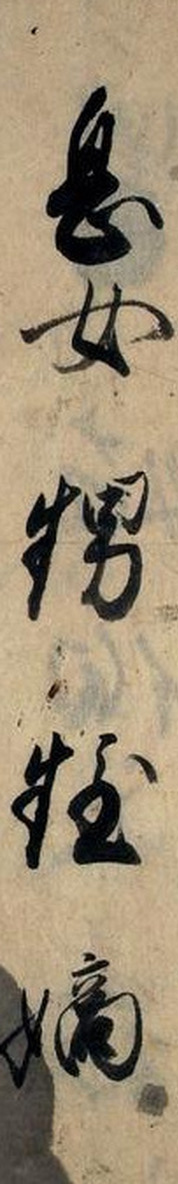息女甥姪嫡
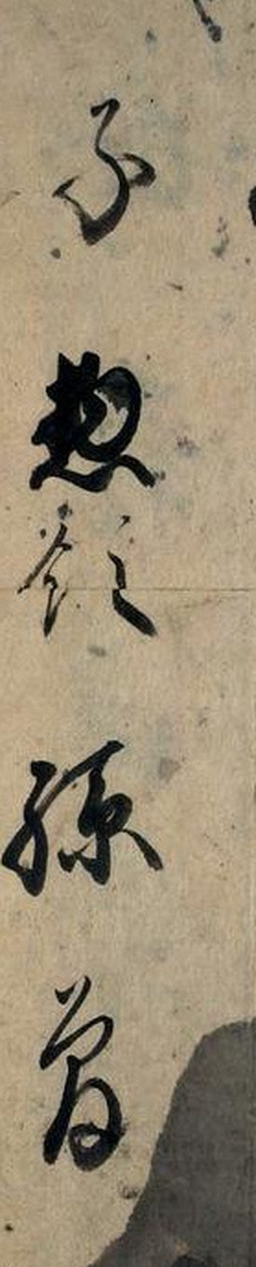子惣領孫曾
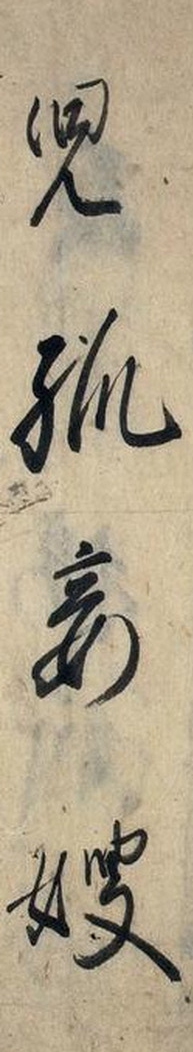児孤妾嫂

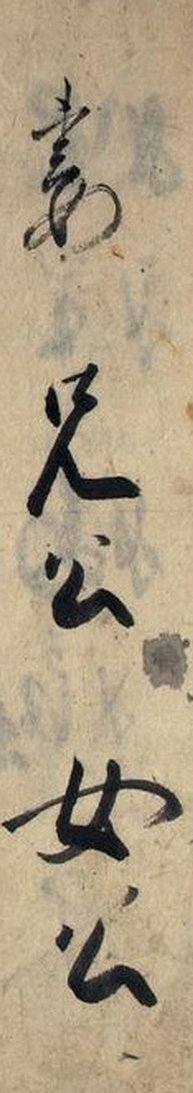妻兄公女公
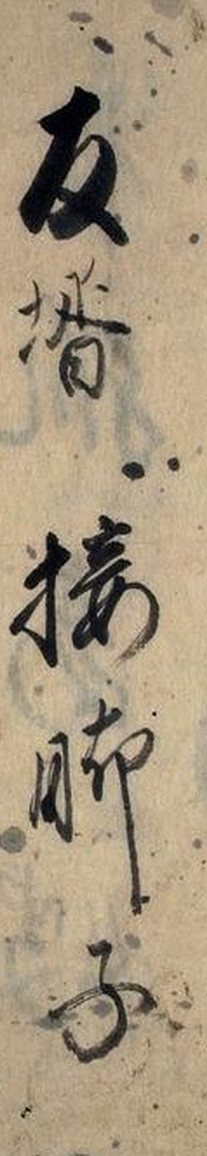反壻接脚子
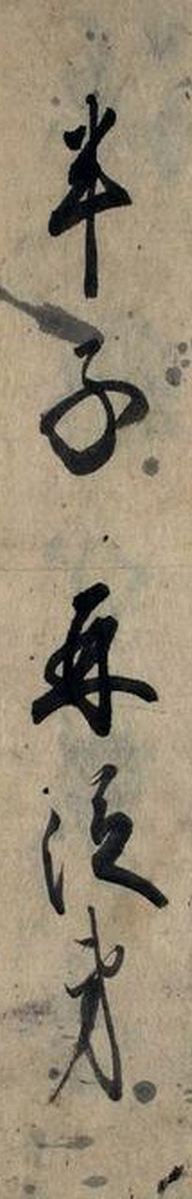半子再従弟
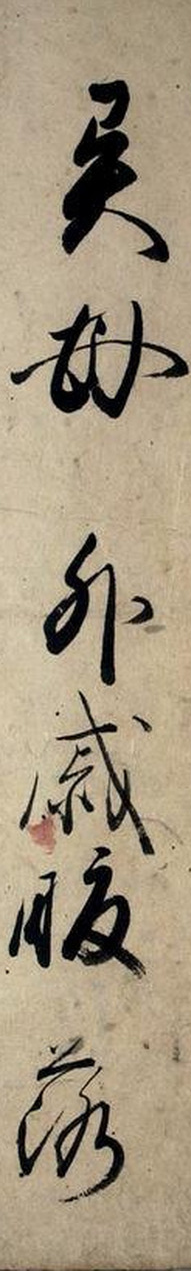異母外戚腹落
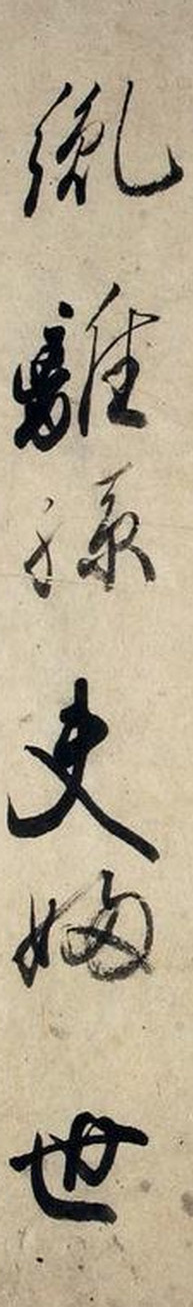胤離縁夫婦世
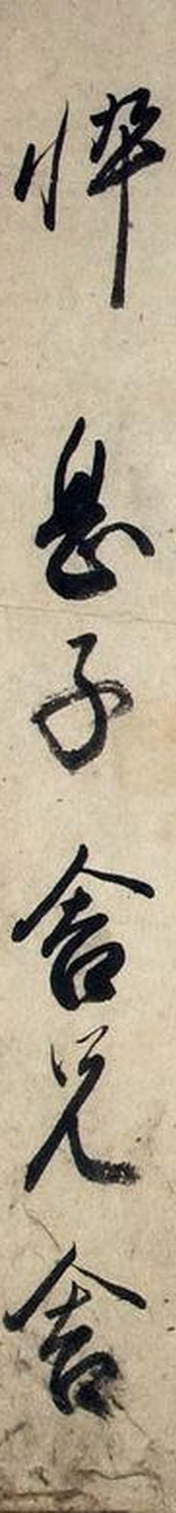倅息子舎兄舎

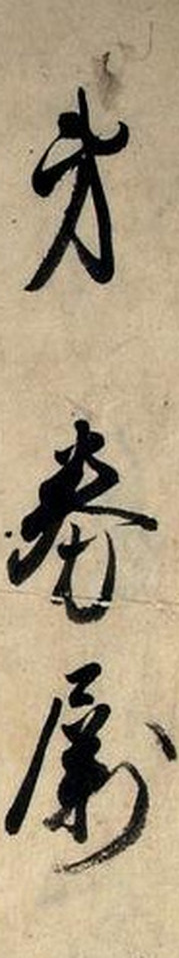弟眷属
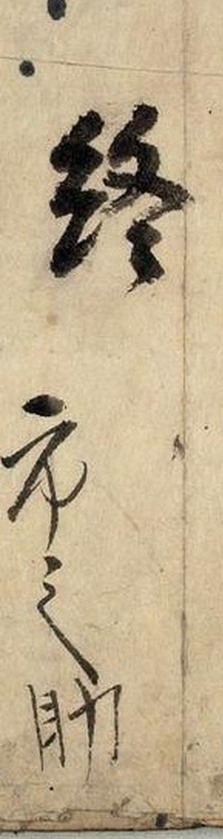終市之助
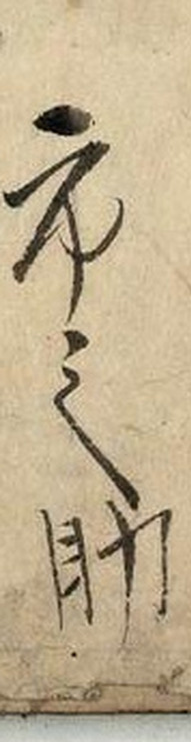市之助
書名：御手本（手習、いろは・数字、「名頭之事」「親戚字尽」「相庭之…
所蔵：福井県文書館 Fukui Prefectural Archives
